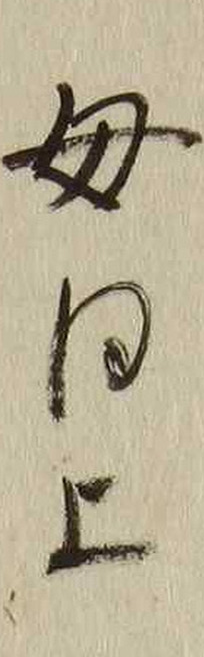母同上
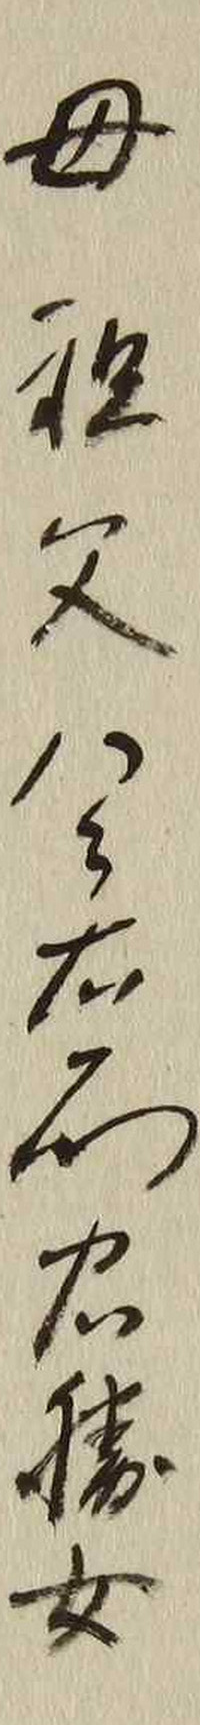母祖父八郎右衛門忠勝女
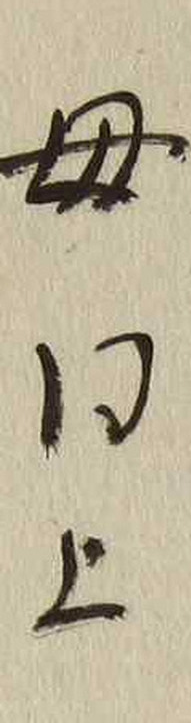母同上
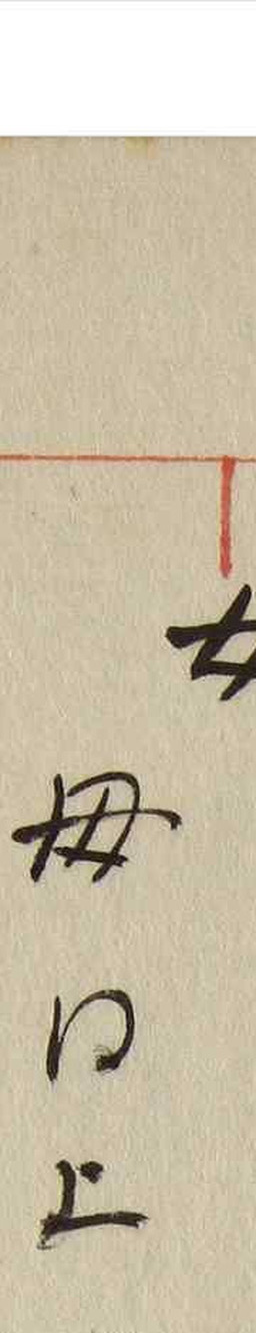母同上
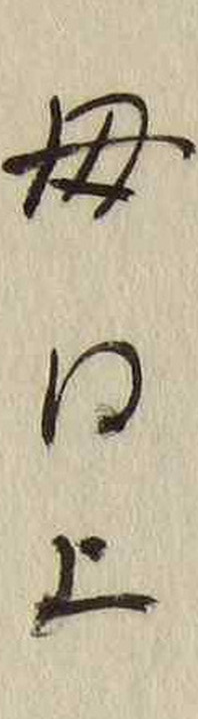母同上

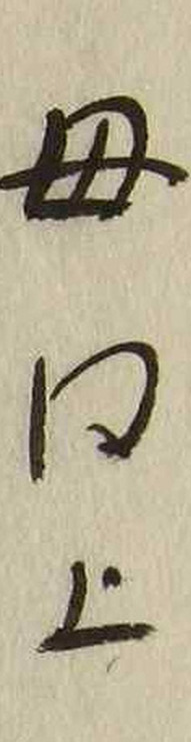母同上
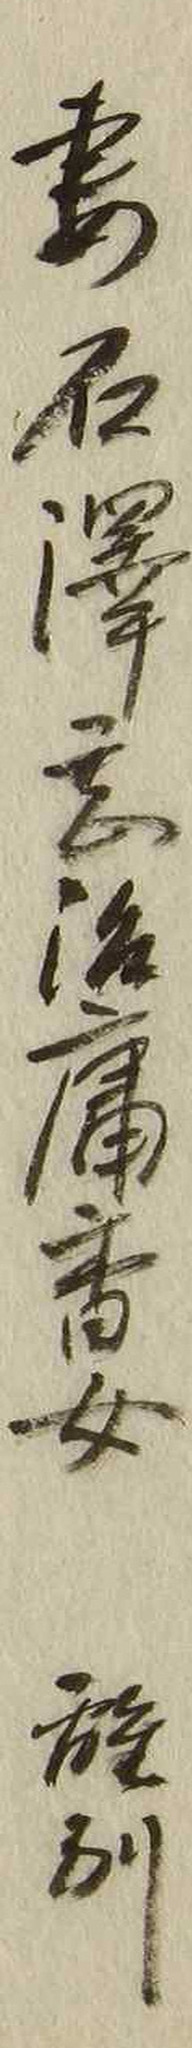妻石沢甚治庸香女離別
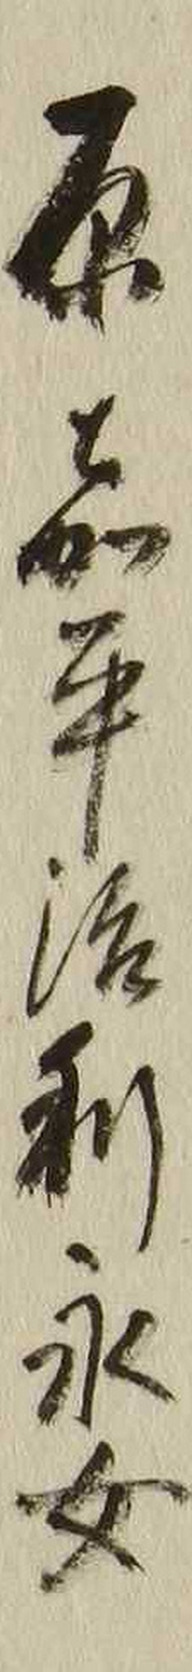原嘉平治利永女
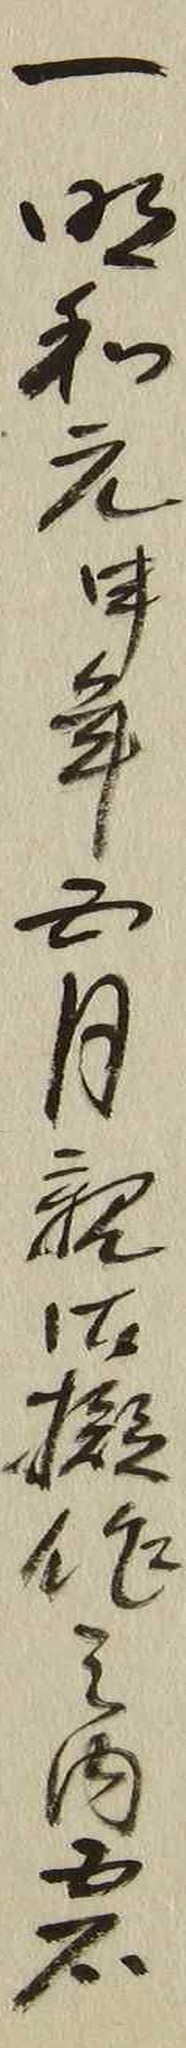一明和元申年五月親御擬作之内五石
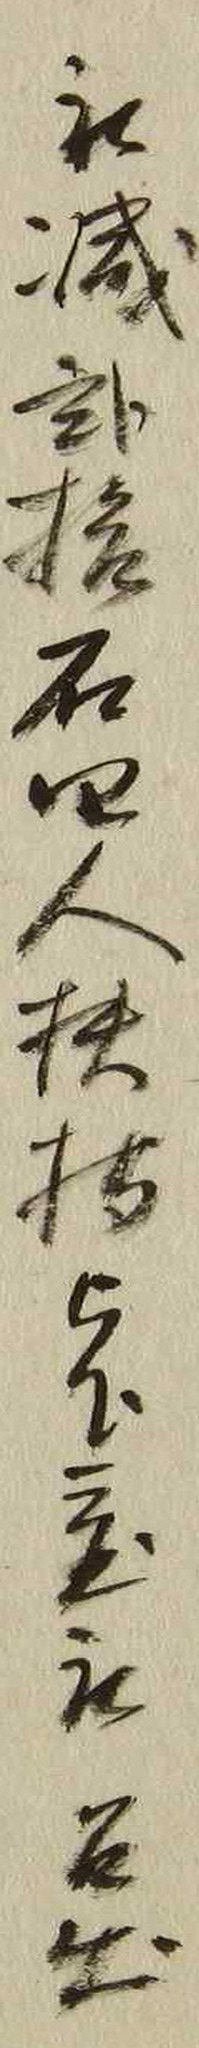被減弐拾石四人扶持被下置被召出
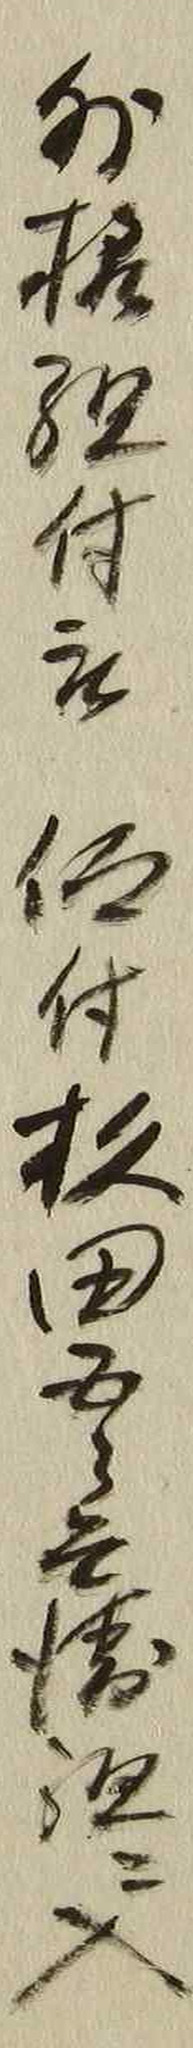外様組付被仰付杉田五郎兵衛組ニ入
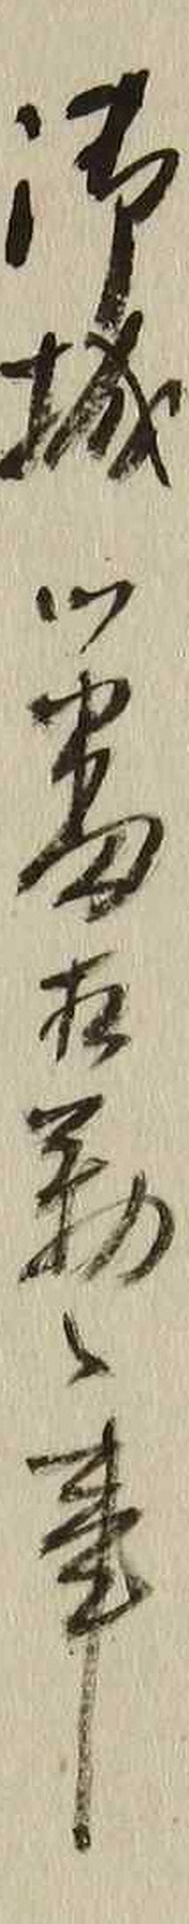御城御番相勤候事
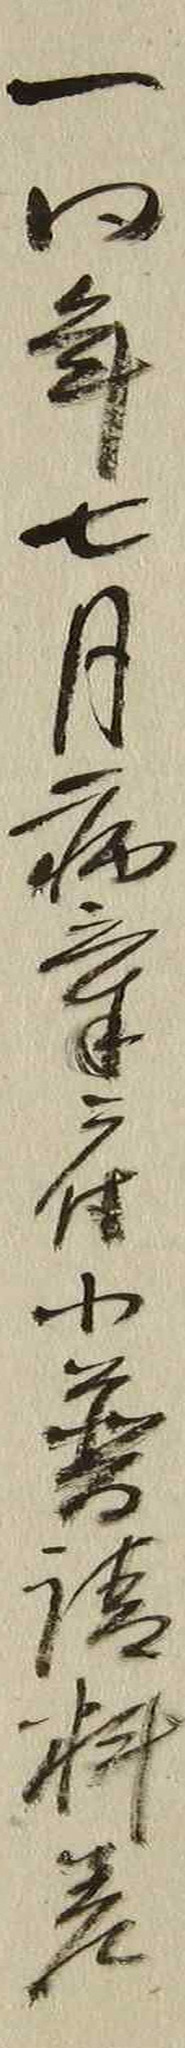一同年七月病気ニ付小普請料差
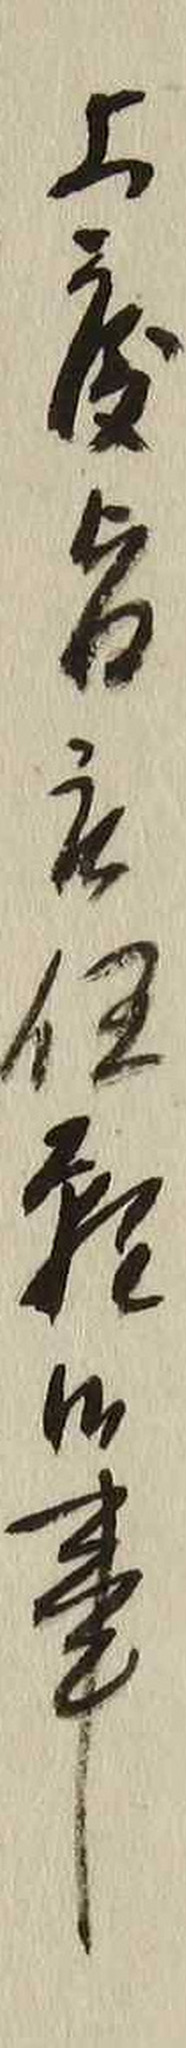上度旨被任願候事
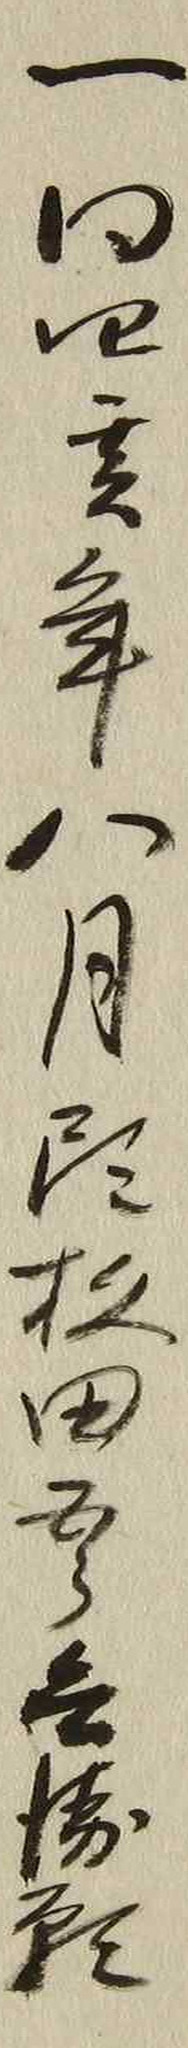一同四亥年八月頭杉田五郎兵衛願
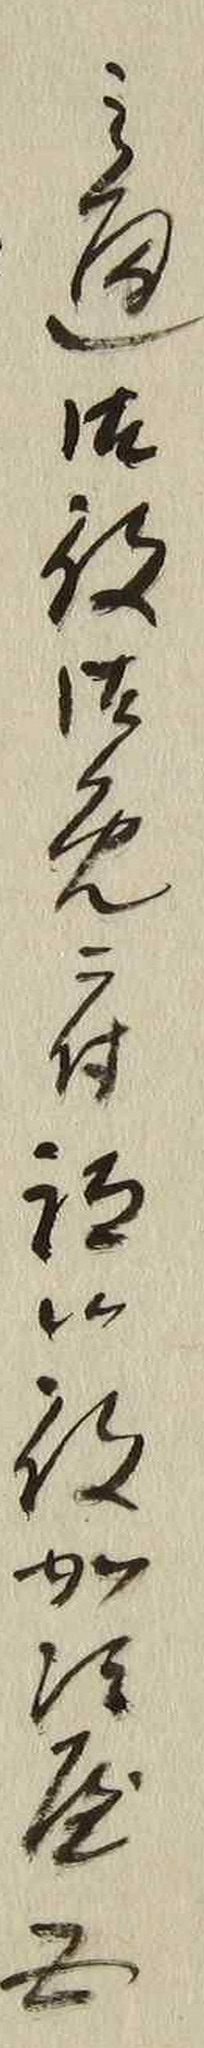之通御役御免ニ付跡御役加須屋五
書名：諸士系譜　巻之359　す之部9
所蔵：会津若松市立会津図書館
